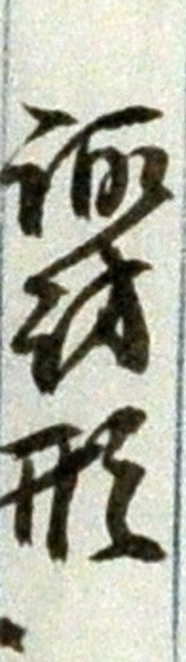諏訪形
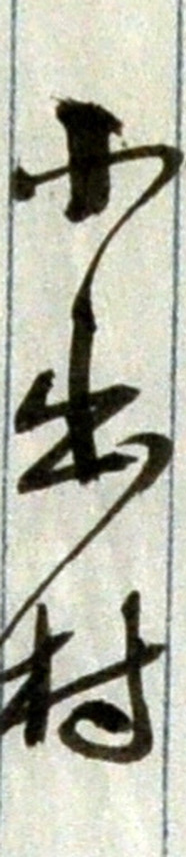小出村
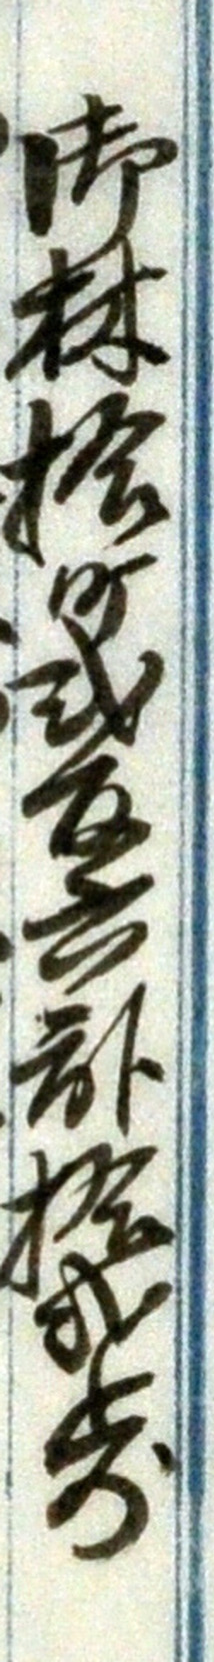御林拾町弐反六畝拾弐歩拾ケ所
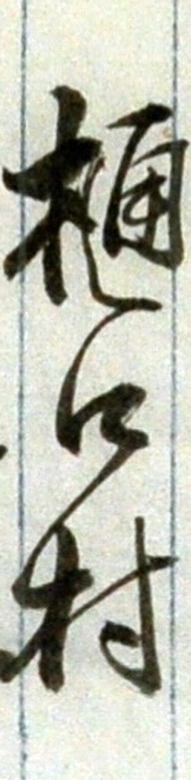樋口村
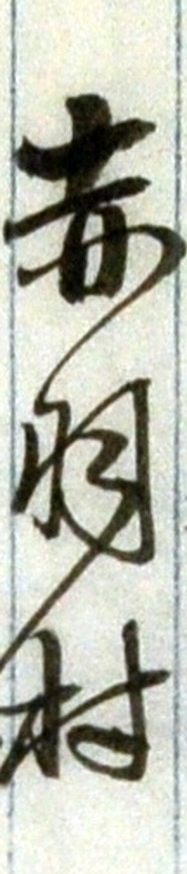赤羽村
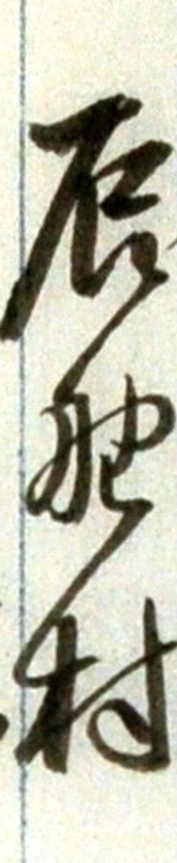辰野村

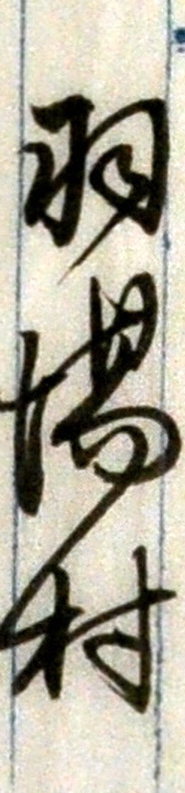羽場村
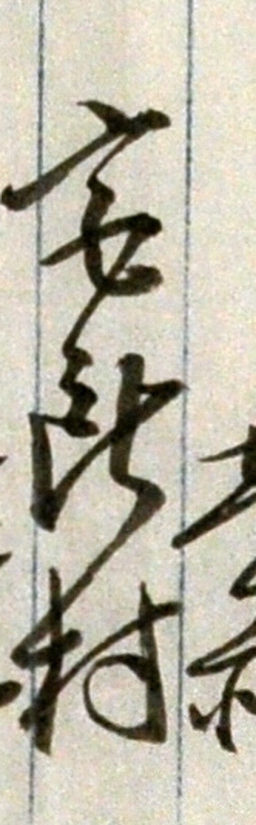宮所村
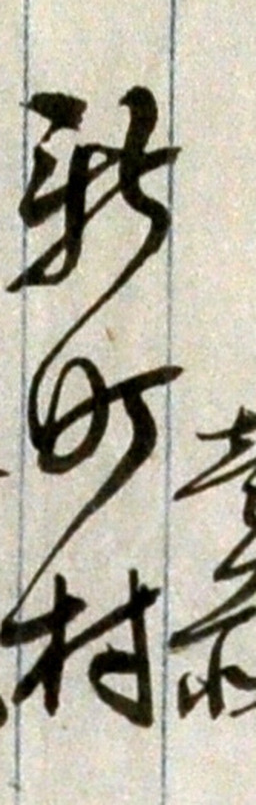新町村
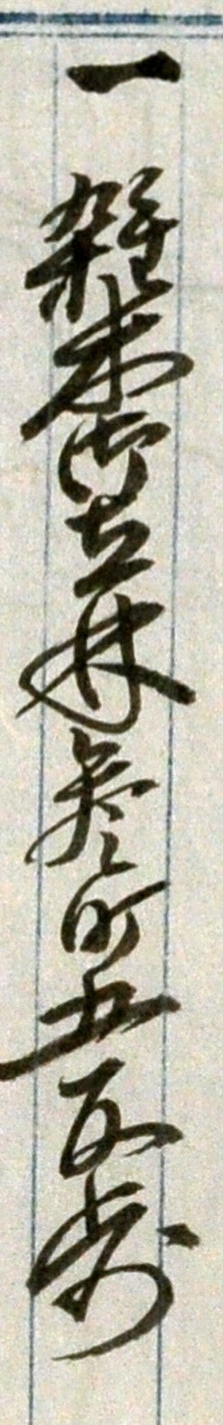一雑木御立林参町五反歩壱ケ所
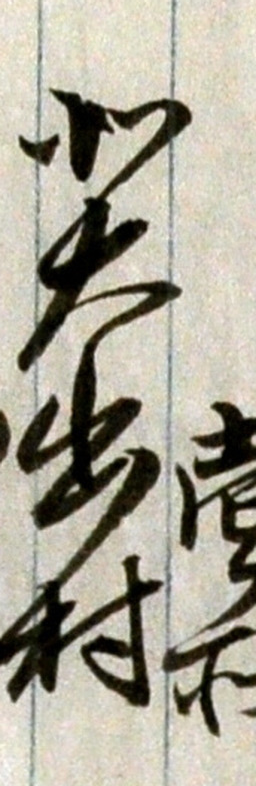北大出村
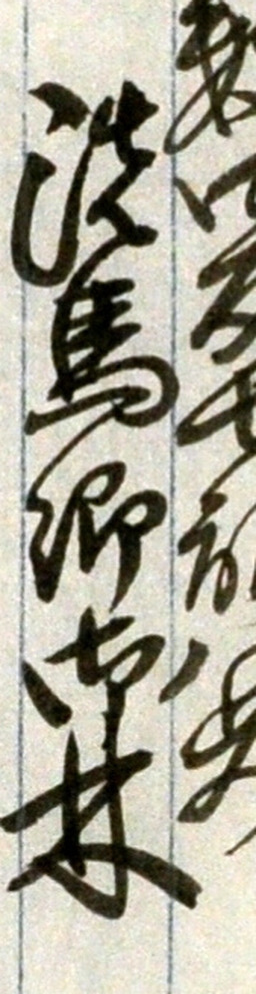洗馬郷御林
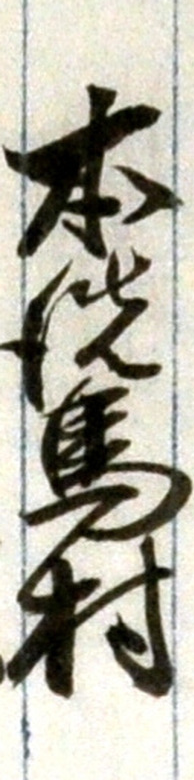本洗馬村
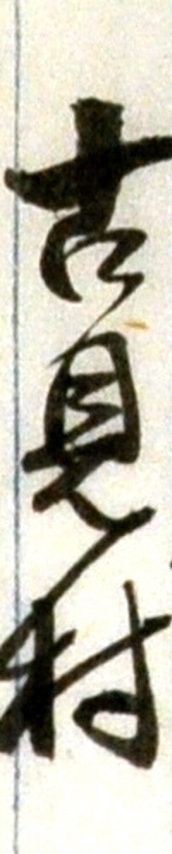古見村
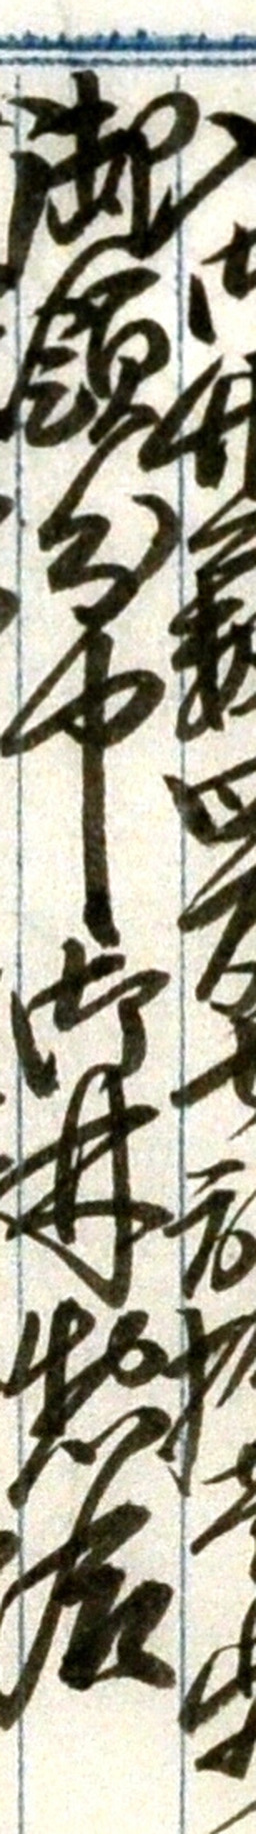御領分中御林惣合
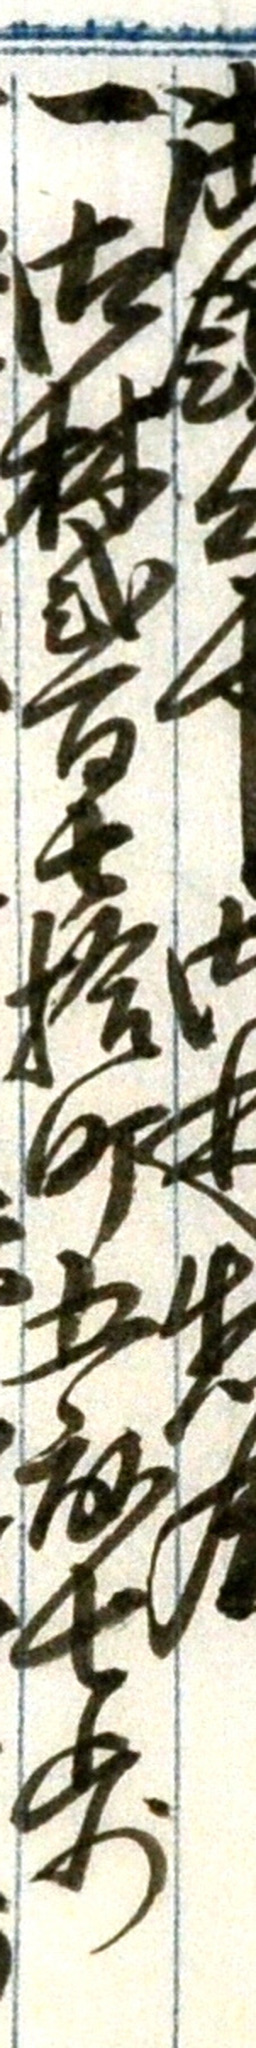一御林弐百七拾町五畝七歩
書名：御山帳
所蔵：伊那市立高遠町図書館・合同会社AMANE
